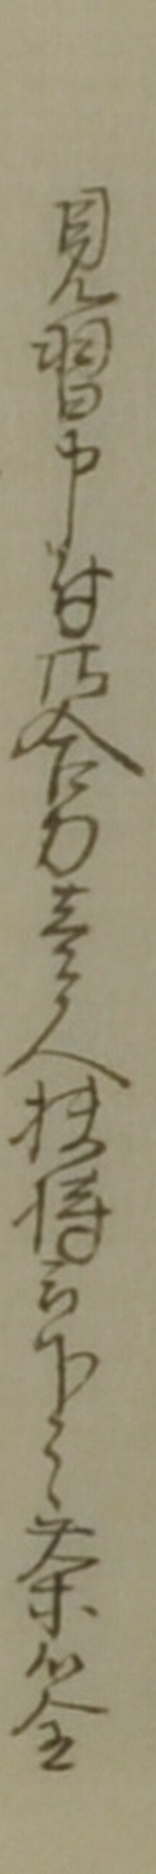見習申付御合力壱人扶持被下之茶筌
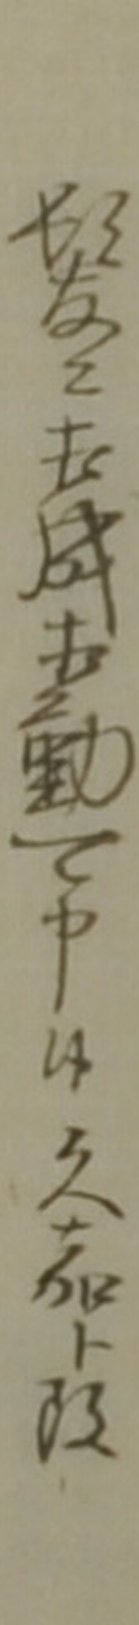髪相成相勤可申候久嘉改
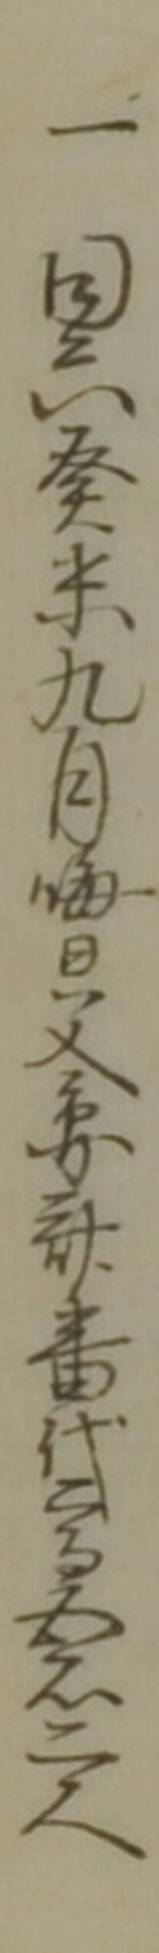一同六癸未九月晦日父円斉番代高五石二人
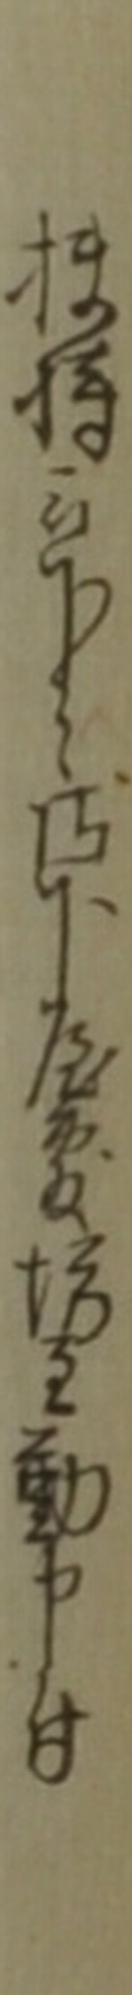扶持被下之御下屋敷坊主勤申付
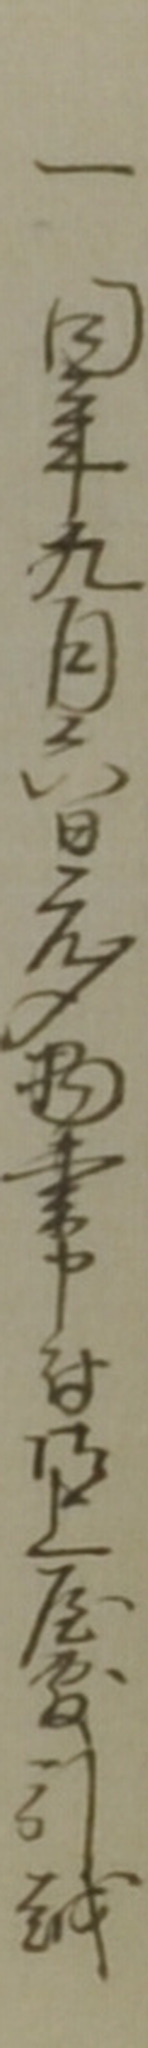一同年九月六日元〆物書申付御上屋敷引越
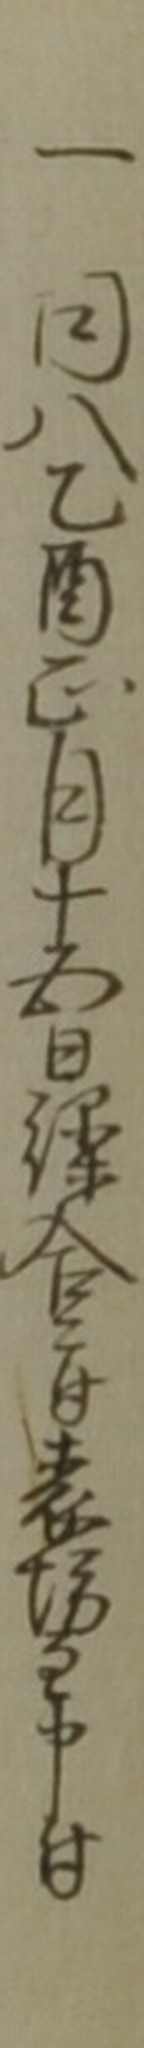一同八酉正月十五日繰合ニ付表坊主申付
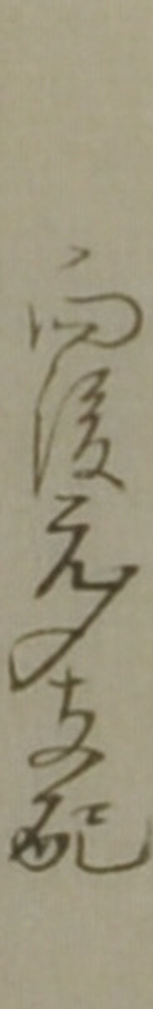向後元〆支配
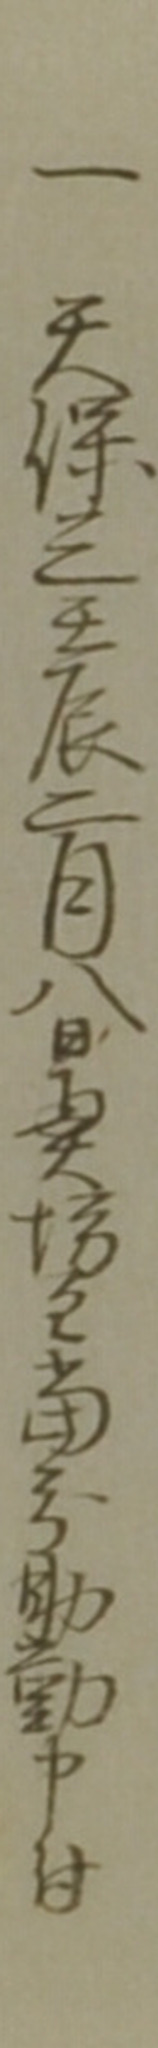一天保三壬辰二月八日奥坊主当分助勤申付
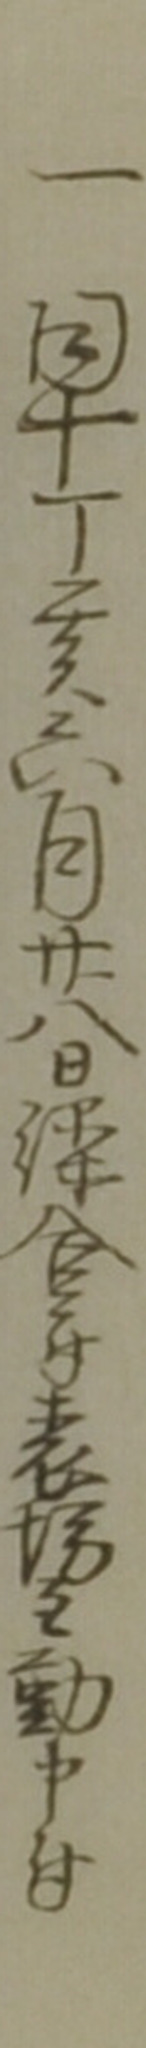一同十丁亥六月廿八日繰合ニ付表坊主勤申付
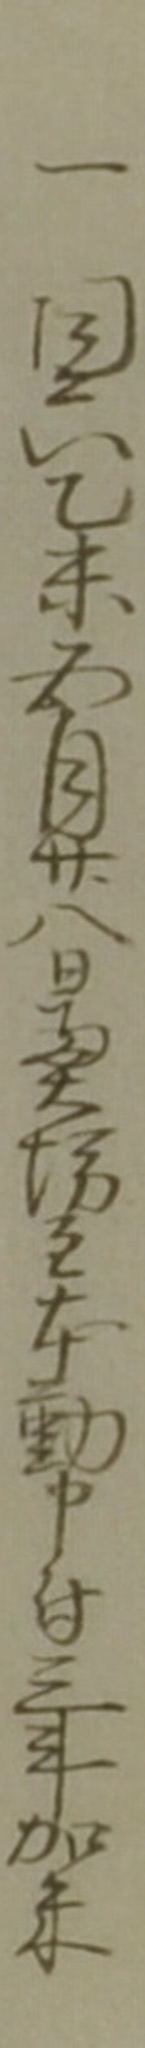一同六乙未五月廿八日奥坊主本勤申付三斗加米
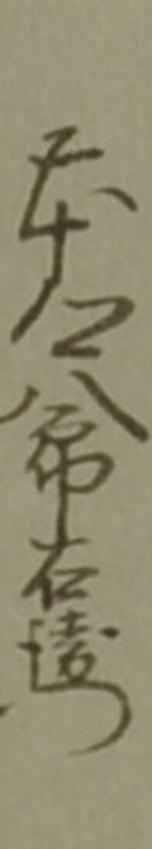本郷八郎右衛門
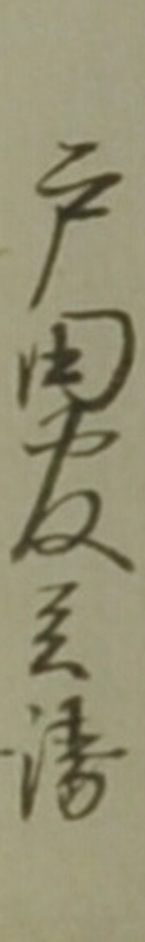戸田官兵衛

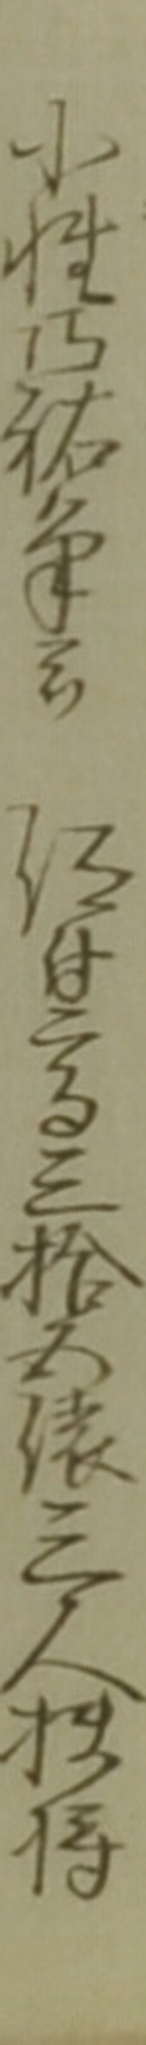小性御祐筆被仰付高三拾五俵三人扶持
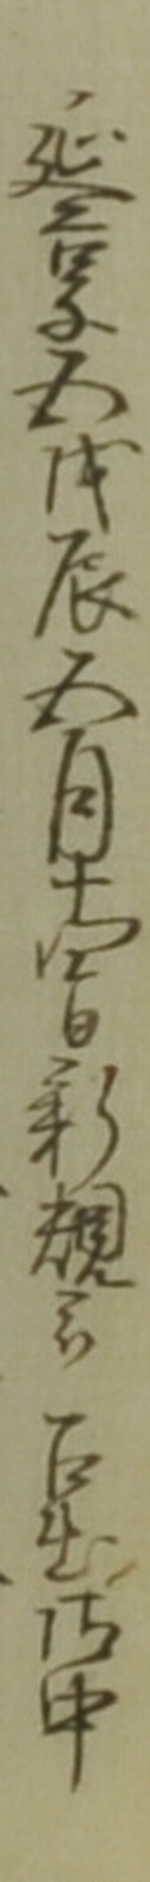一延享五戊辰五年十四日新規被召出御中
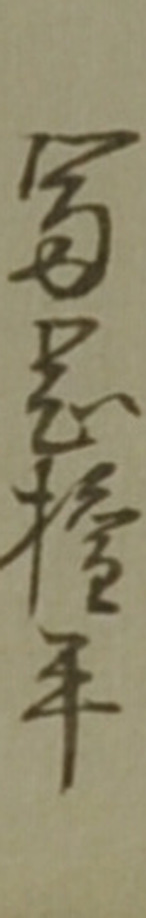冨岡権平
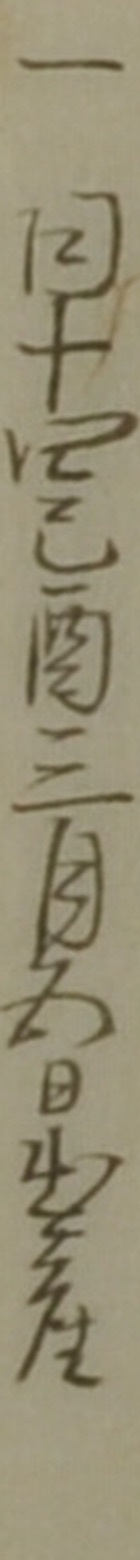一同十四己酉三月五日出産
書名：無足廃家（弐）
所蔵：伊那市立高遠町図書館・合同会社AMANE
